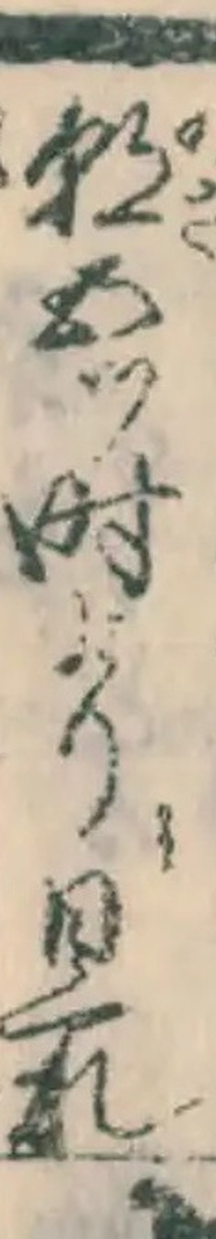朝五ツ時より日くれ
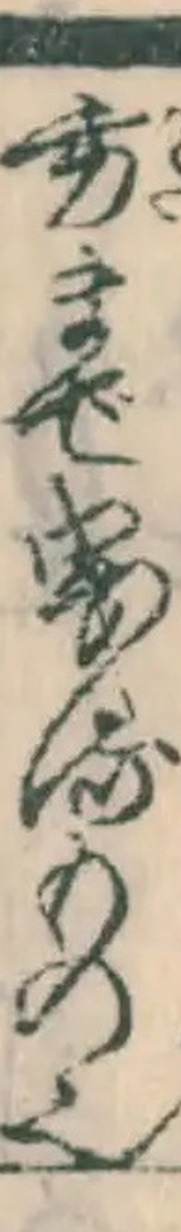方まで曳るもの也
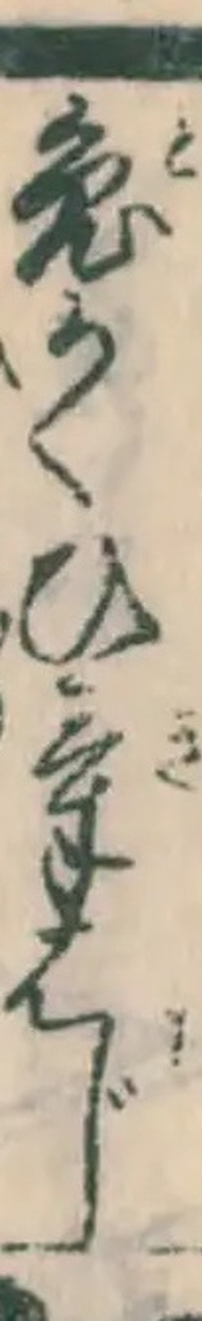兎かくひ気はじ
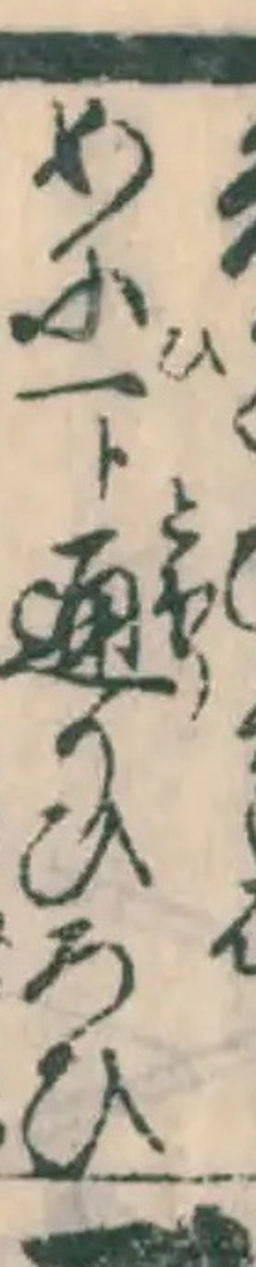めに一ト通ひろひ
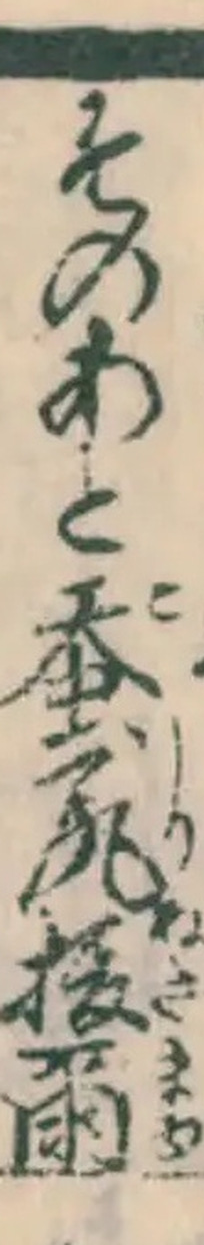そのあと蚕尻抜繭
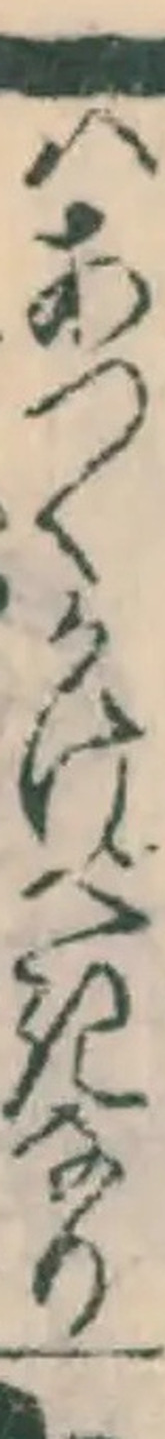はあつくかけべきなり
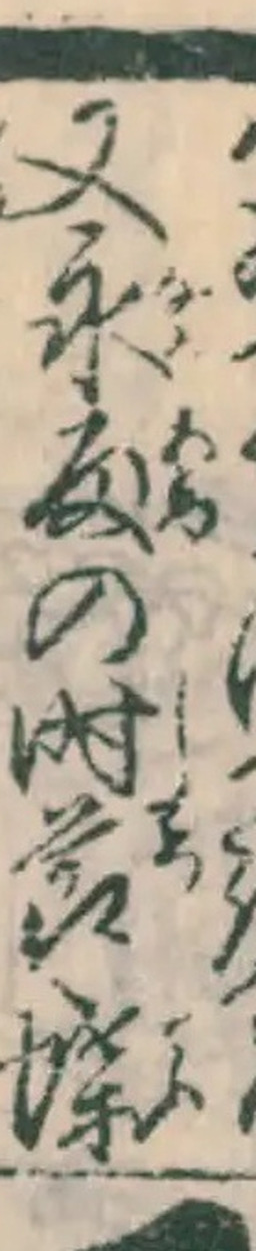又永雨の時節蝶
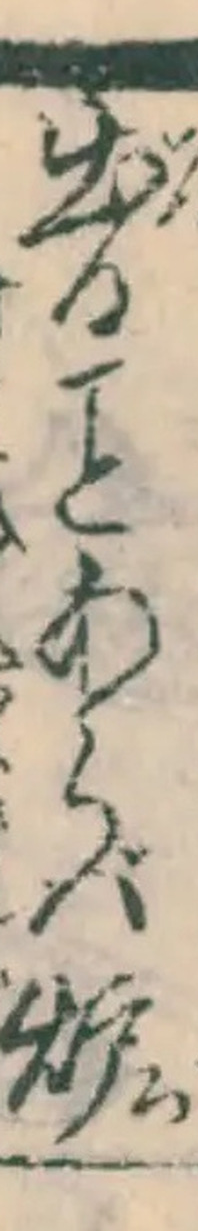出ることあらば炉
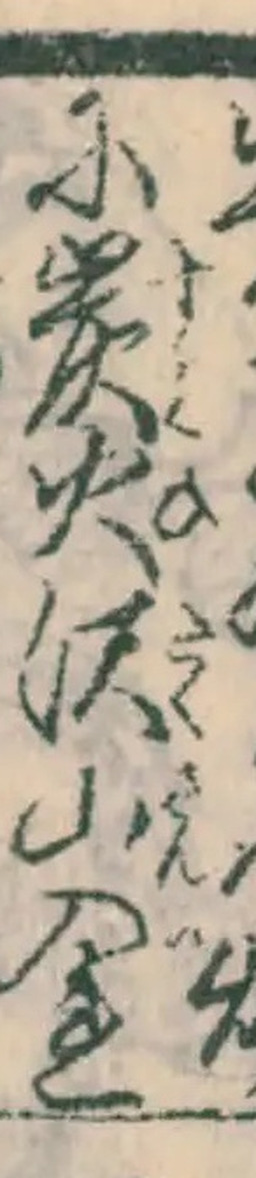に炭火沢山入れ
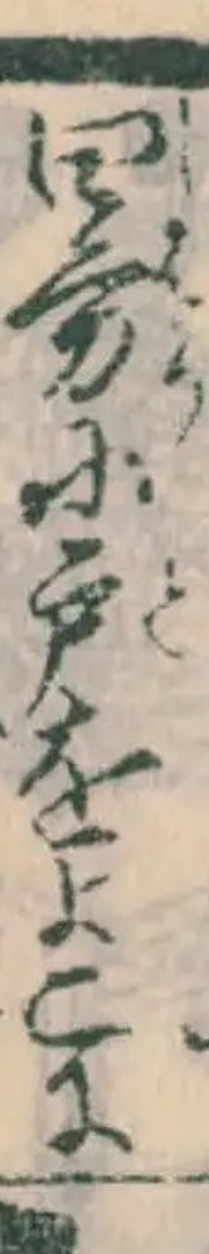四方に戸をよこに
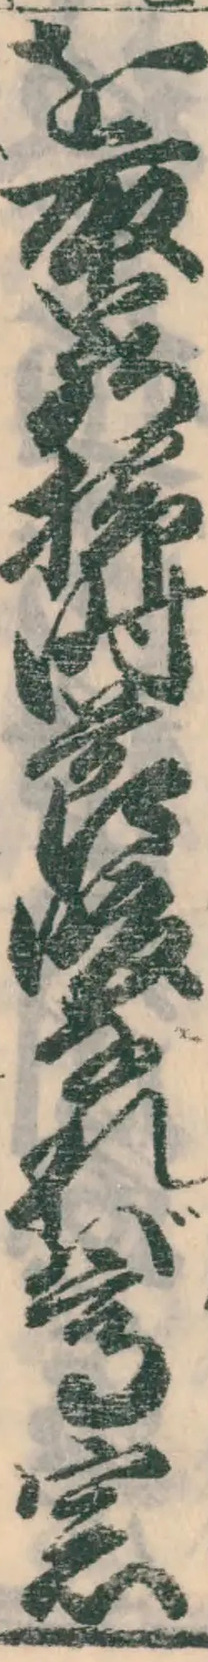を取若掃時節暖なれば高窓
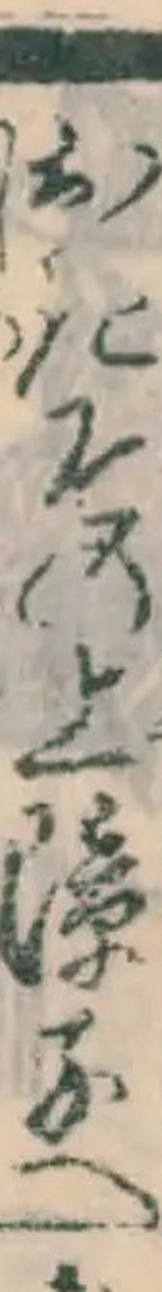おきその上障子へ
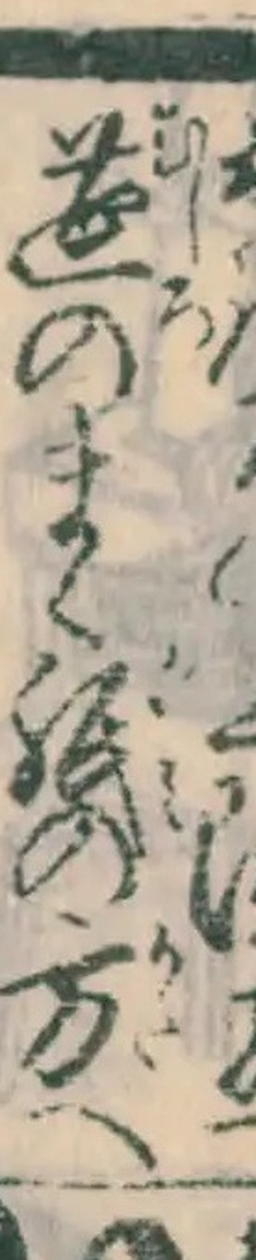筵のまゝ紙の方へ
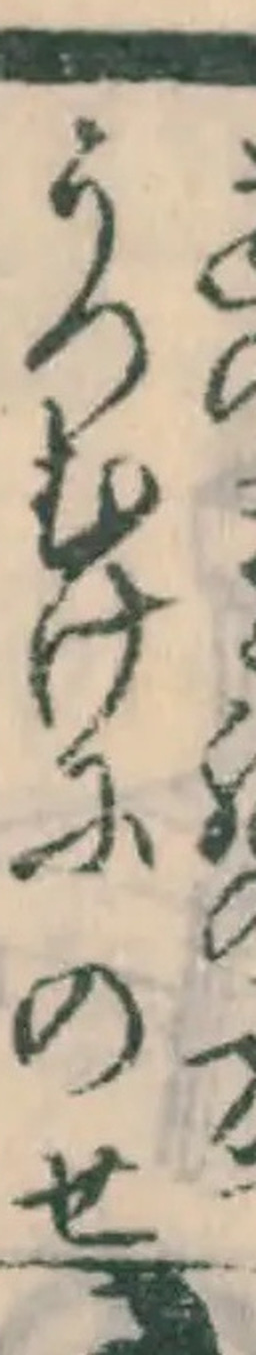うつむけにのせ
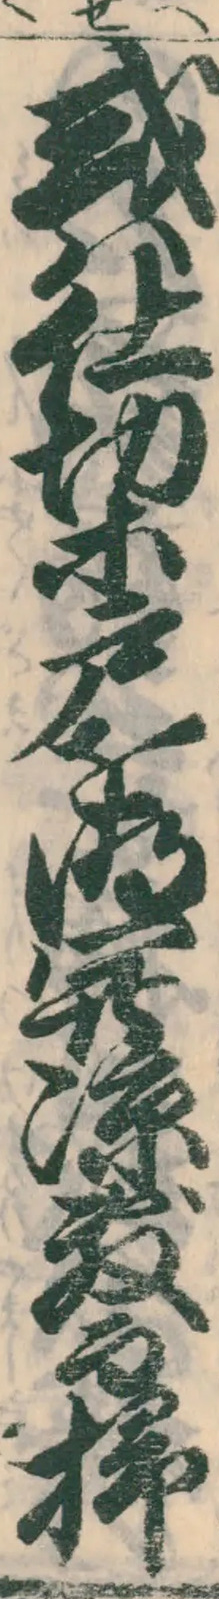或は仕切等戸を明開涼敷て掃
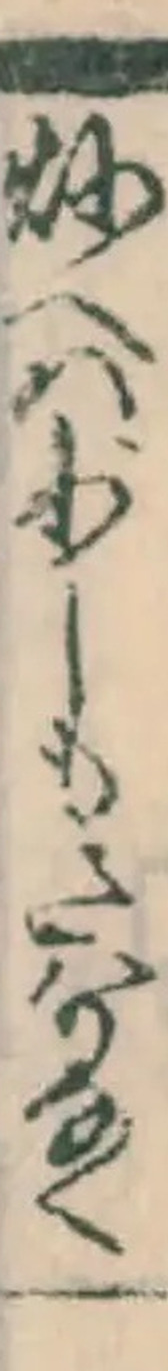炒へは少しもさはりなく
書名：養蚕往来
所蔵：国立国会図書館 National Diet Library, JAPAN
